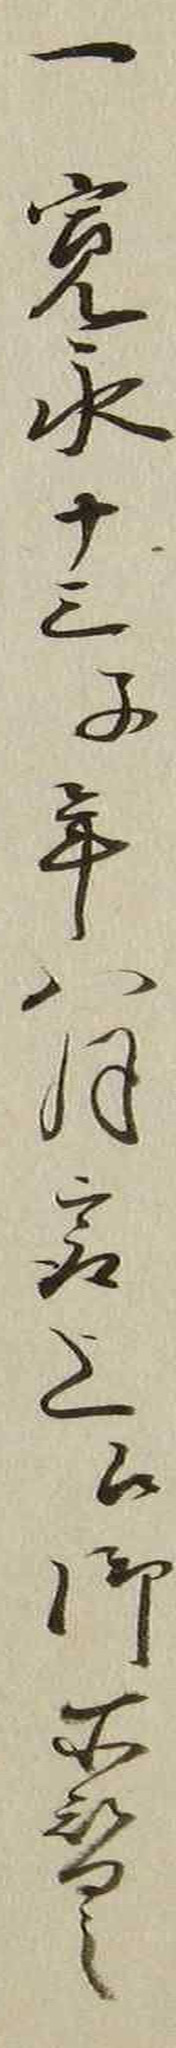一寛永十三子年八月最上江御所替之
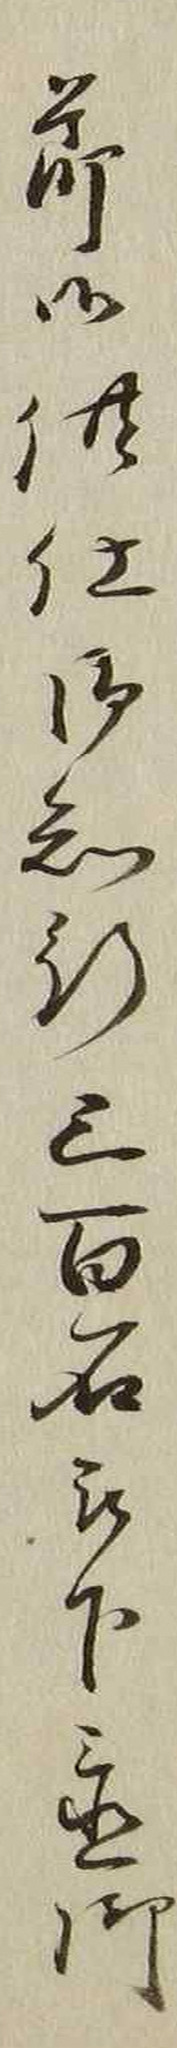節御供仕御知行三百石被下置御
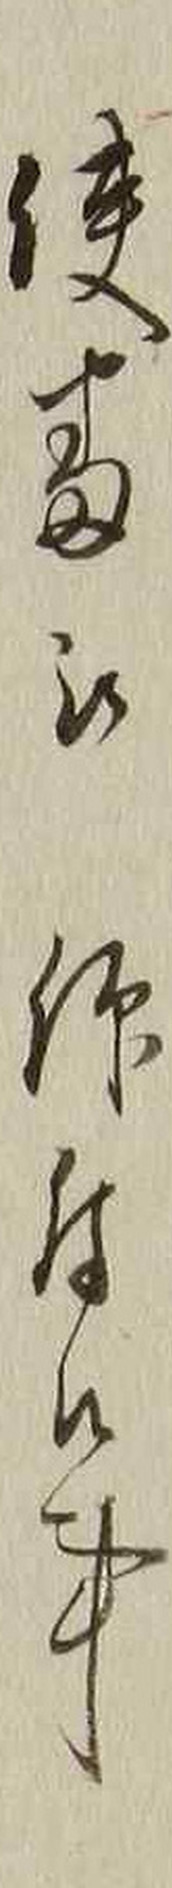使番被仰付候事
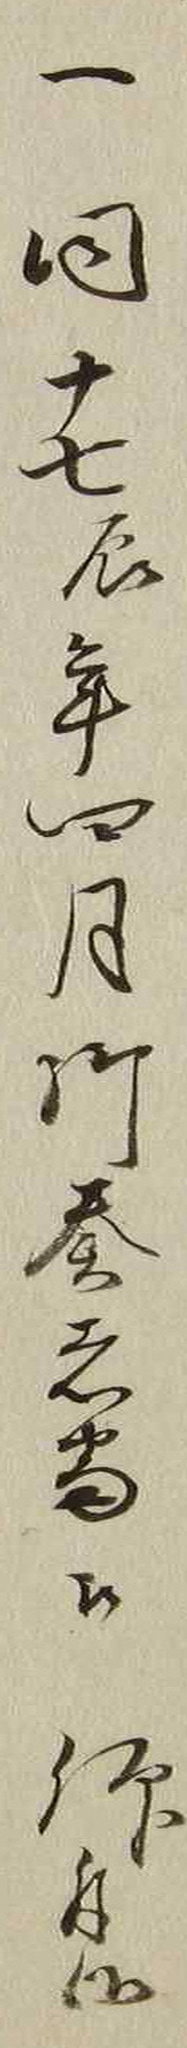一同十七辰年四月御奏者番被仰付候
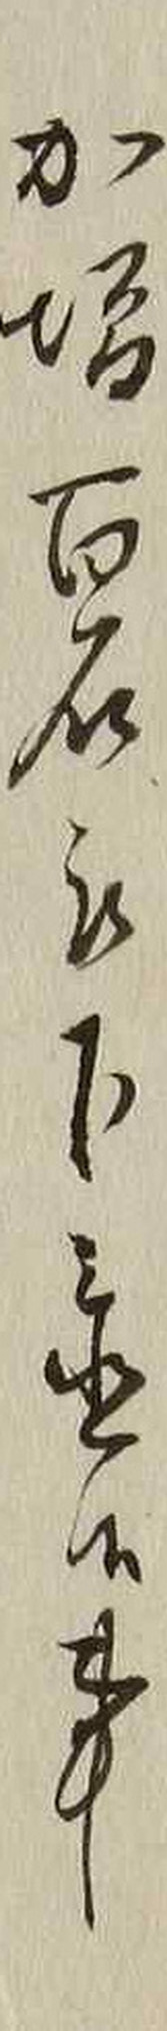加増百石被下置候事
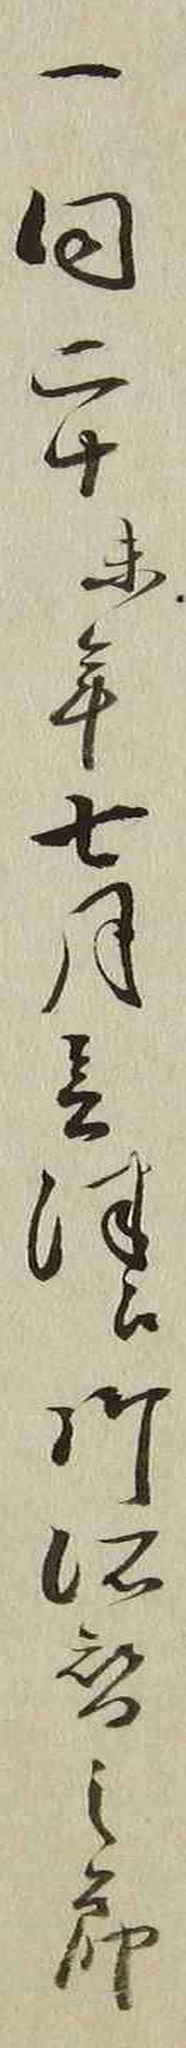一同二十未年七月会津江御所替之節
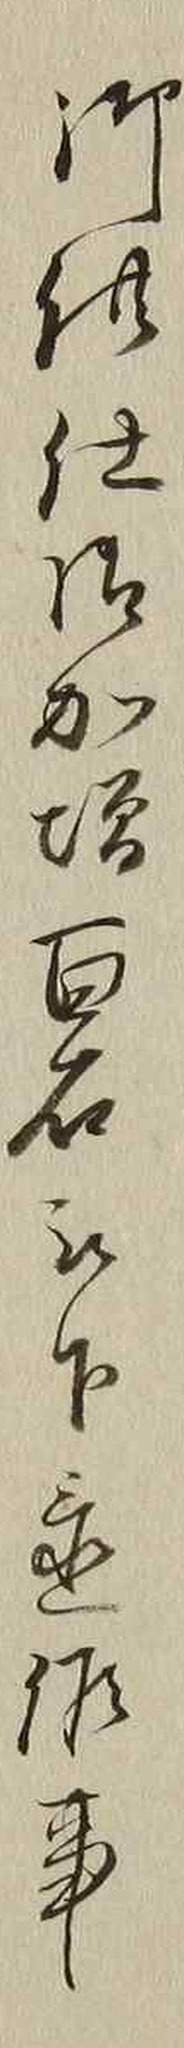御供仕御加増百石被下置候事
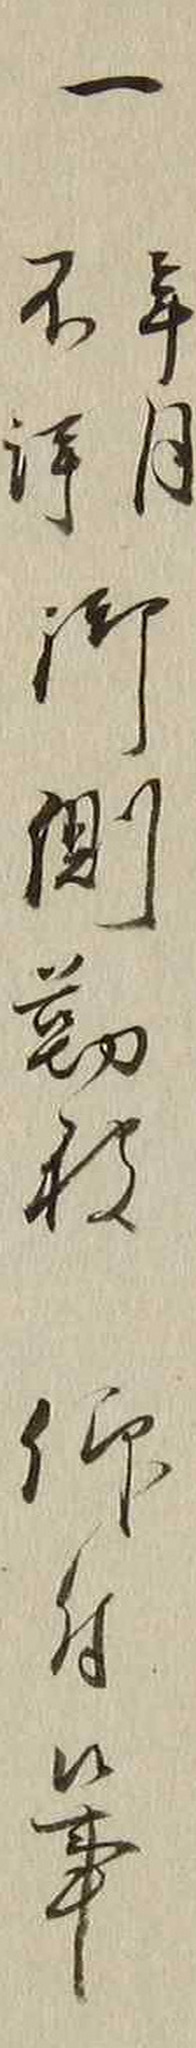不詳御側勤被仰付候事
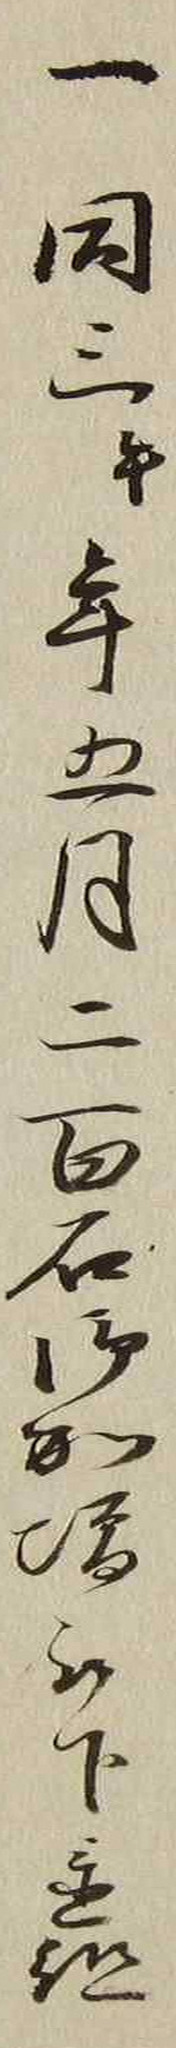一同三午年五月二百石御加増被下置組
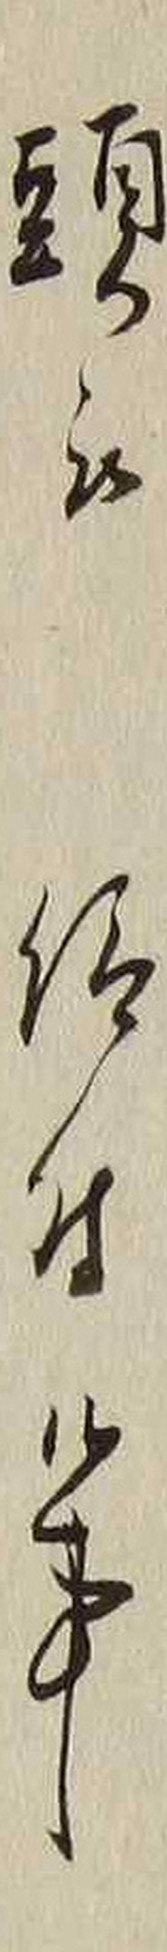頭被仰付候事
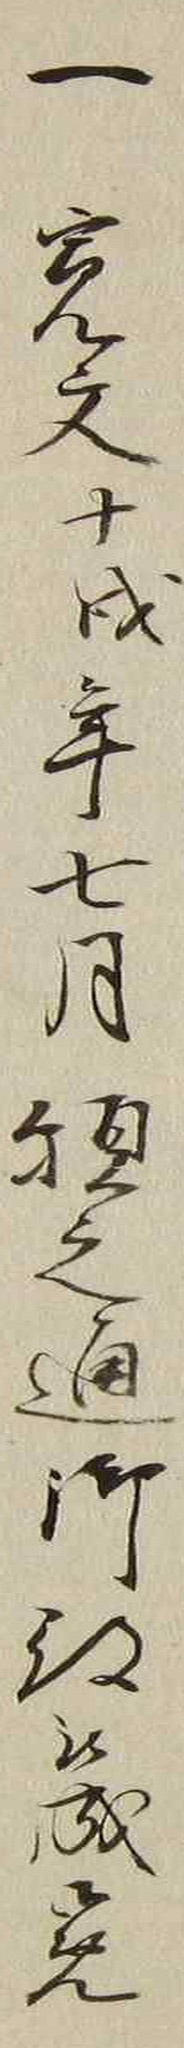一寛文十戌年七月願之通御役被成御免
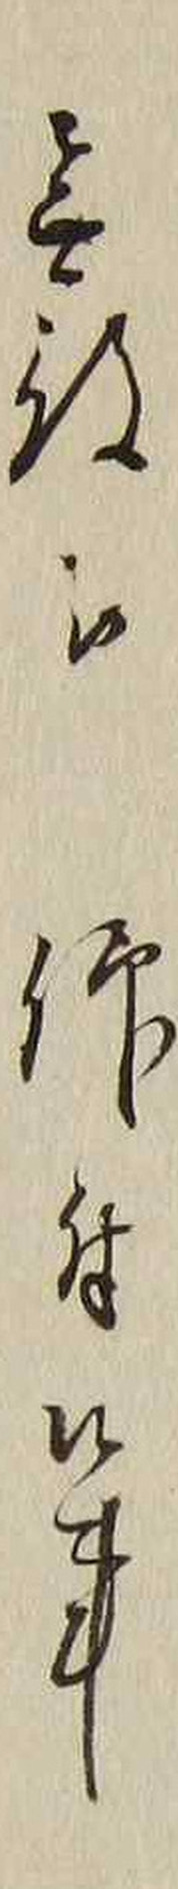使番被仰付候事
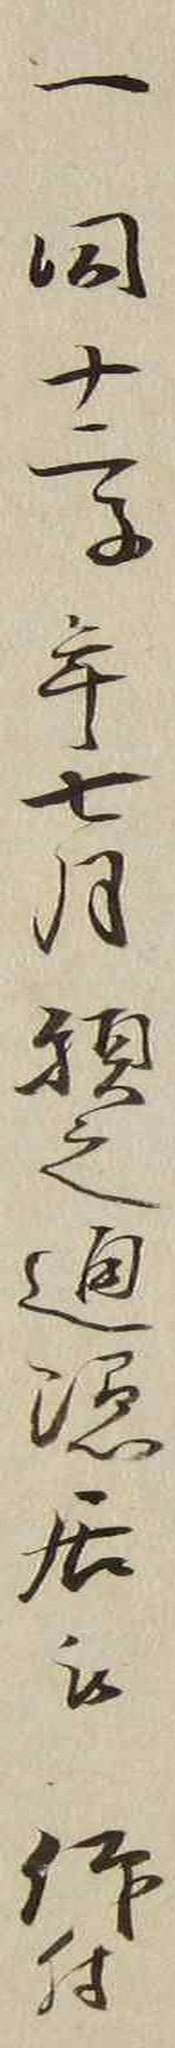一同十二子年七月願之通隠居被仰付

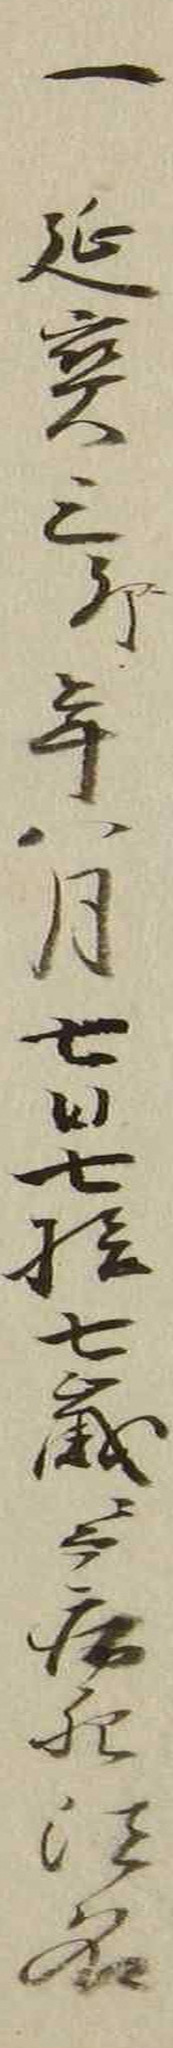一延宝三卯年八月七日七拾七歳ニ而病死法名
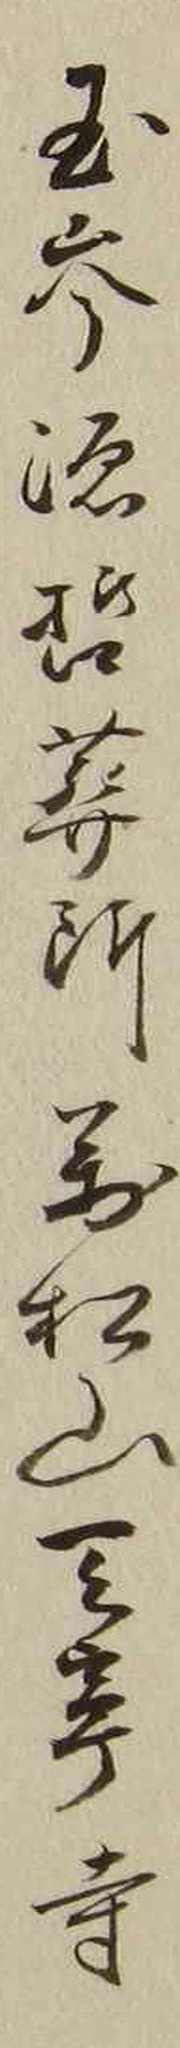玉岑源哲葬所万松山天寧寺
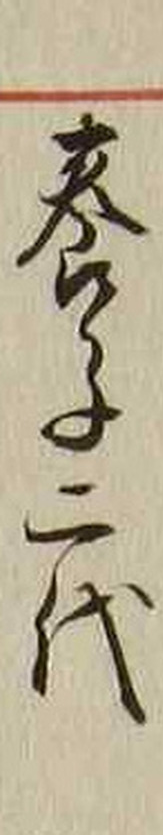養子二代
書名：諸士系譜　巻之25　い之部25
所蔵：会津若松市立会津図書館
